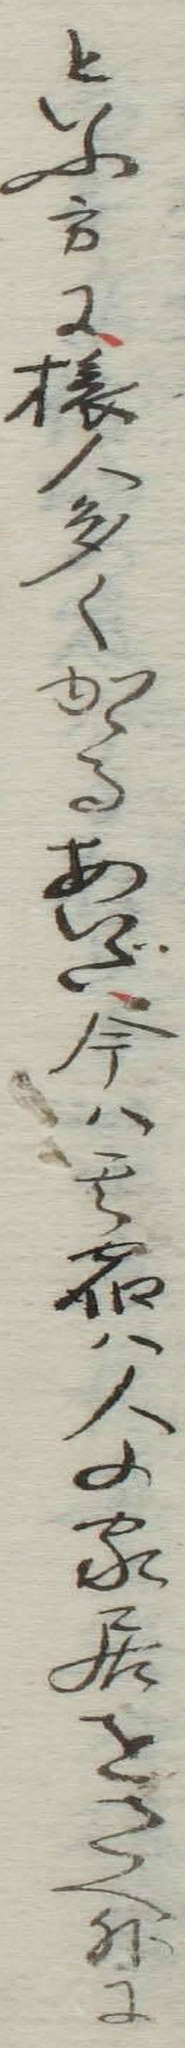といふ方に、旅人多くかゝるあいだ、今は其宿は人の家居をさへ外に
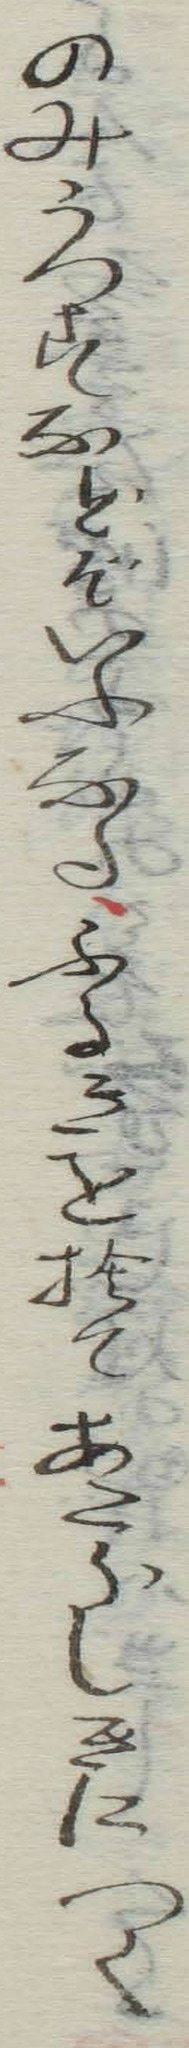のみうつすなどぞいふなる、ふるきを捨てあたらしきにつく
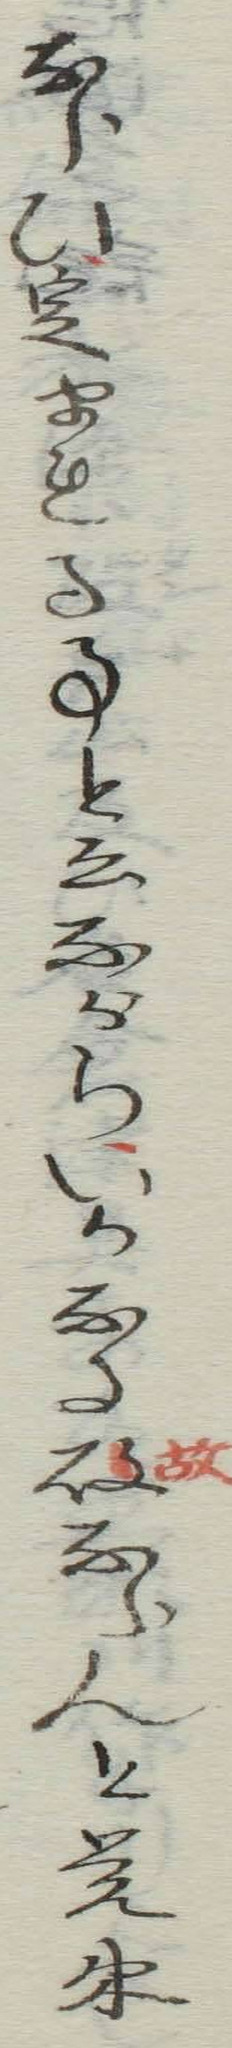ならひ、定まれる事と云ながら、いかなる故ならんと覚束
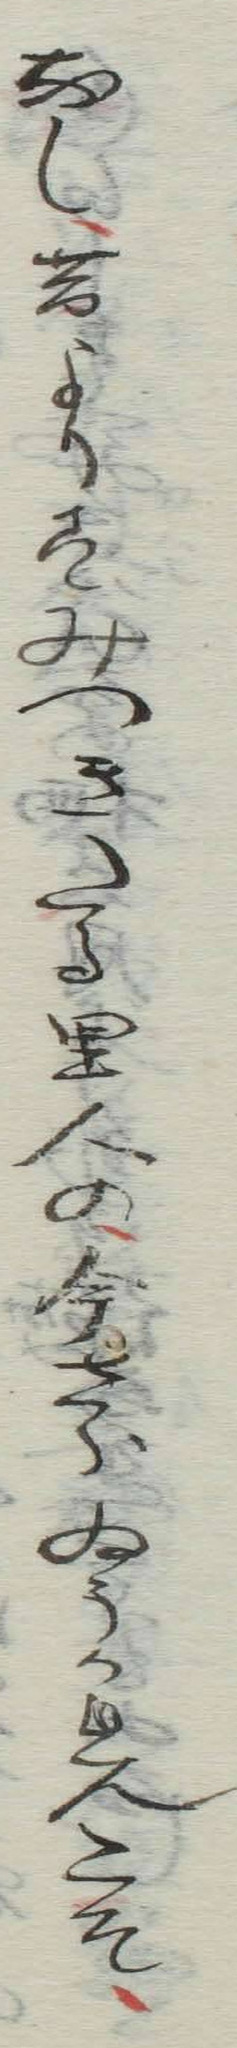なし、昔よりすみつきたる里人の、今さらゐうかれんこそ、
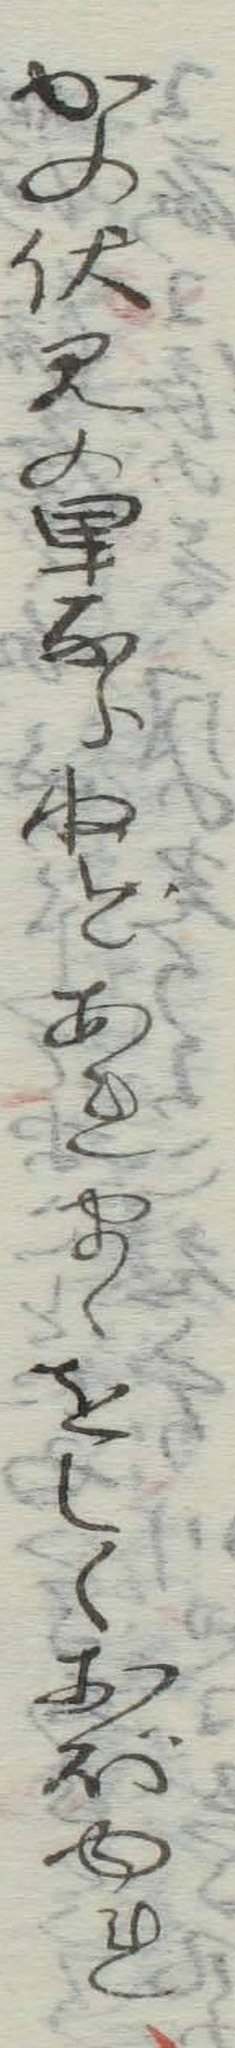かの伏見の里ならねとあれまくをしくおぼゆれ、
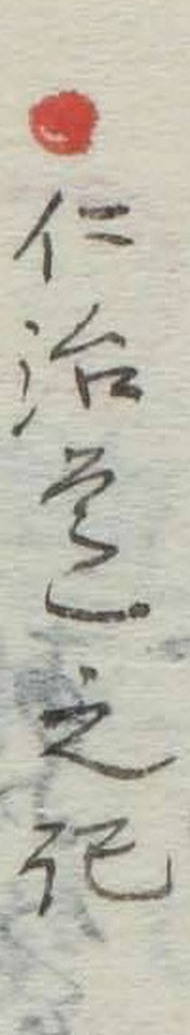●仁治道之記
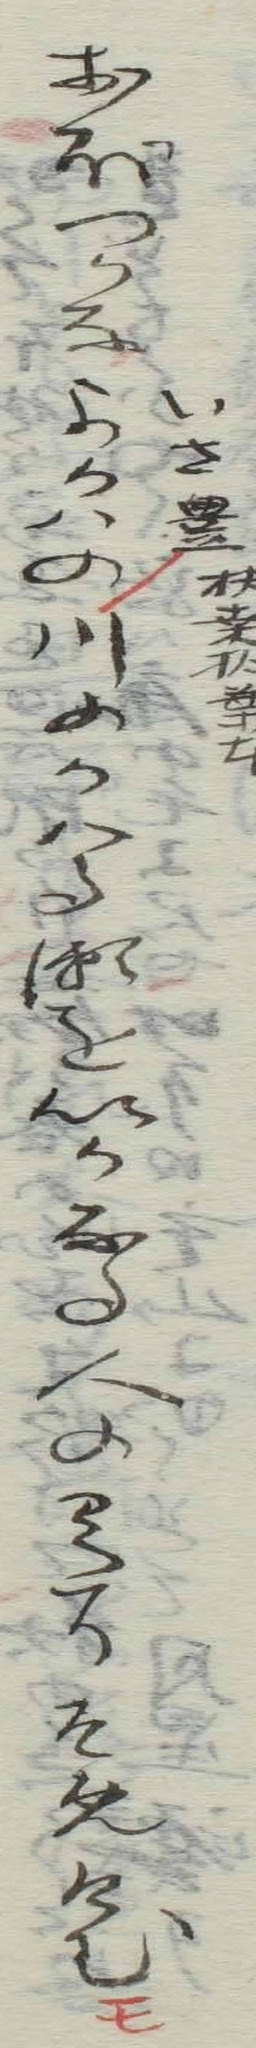おぼつかなよかはの川のかはる瀬をいかなる人のわたりそめけむモ
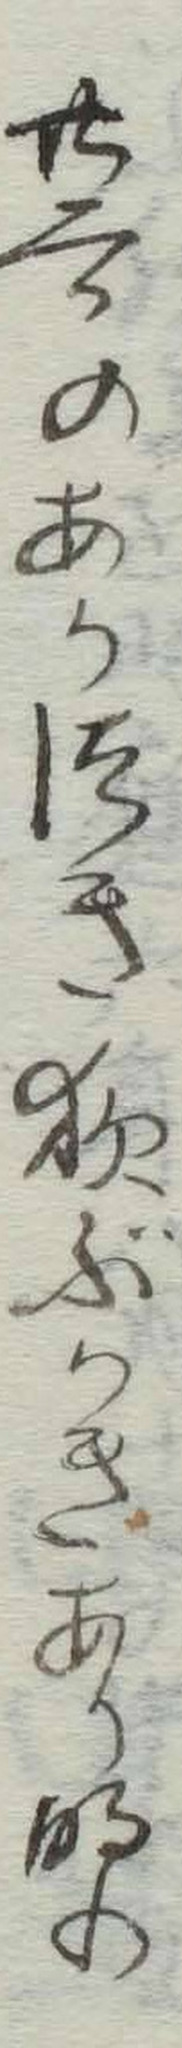廿ニ日のあかつき夜ぶかきあり明の
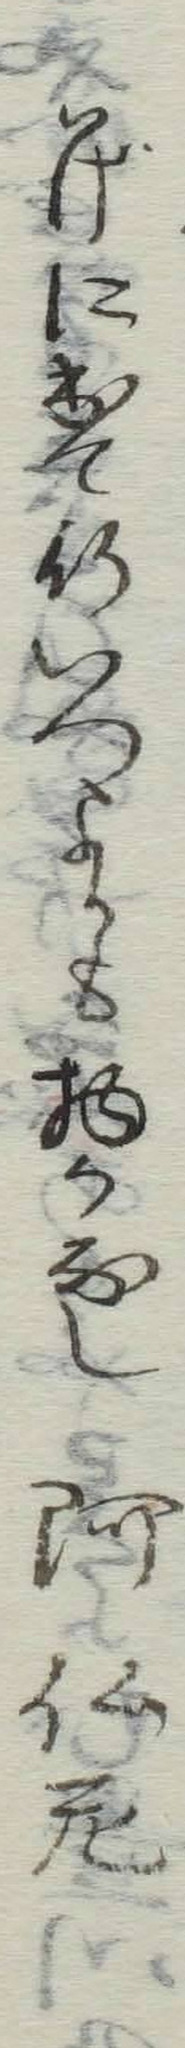かげに出て行いつよりも物かなし阿仏尼
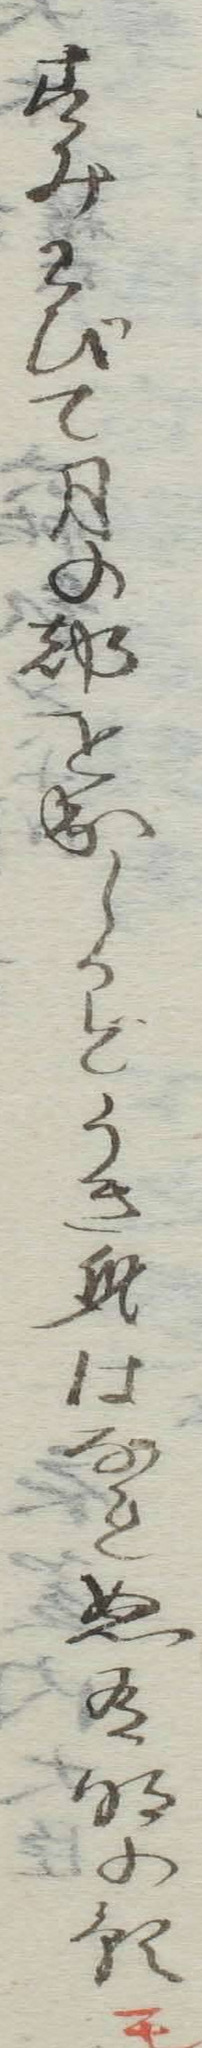すみわびて月の都を出しかどうき身はなれぬ有明の影モ
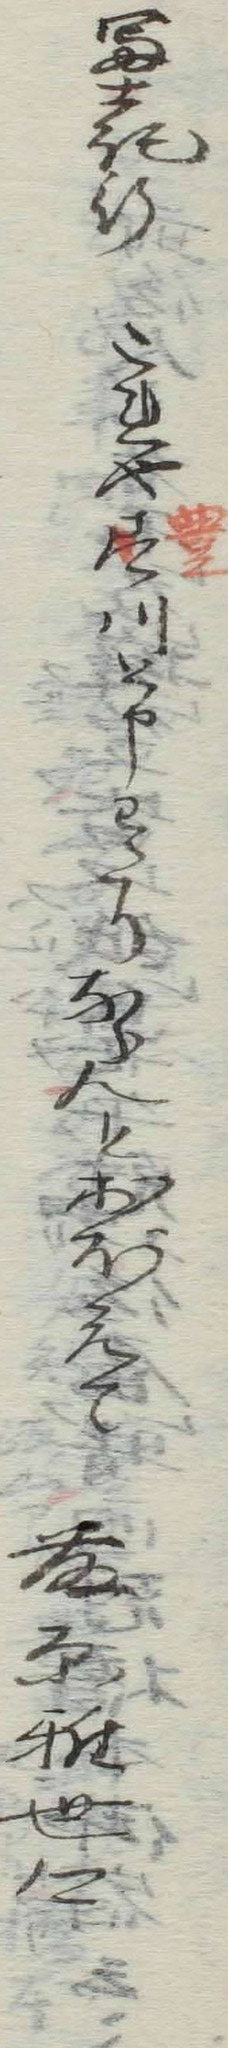●富士紀行これや豊川と申わたりならんとおぼえて藤原雅世卿
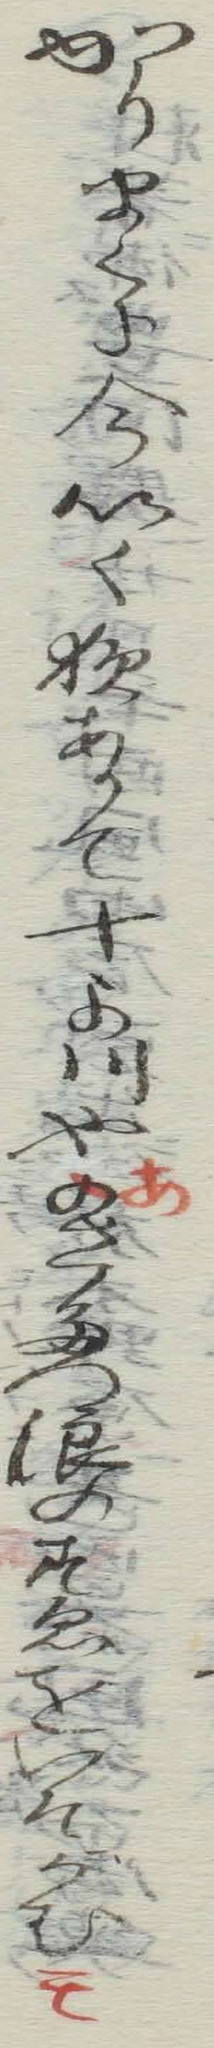かりまくら今いく夜ありて十よ川やあさたつ浪のすゑをいそがむモ
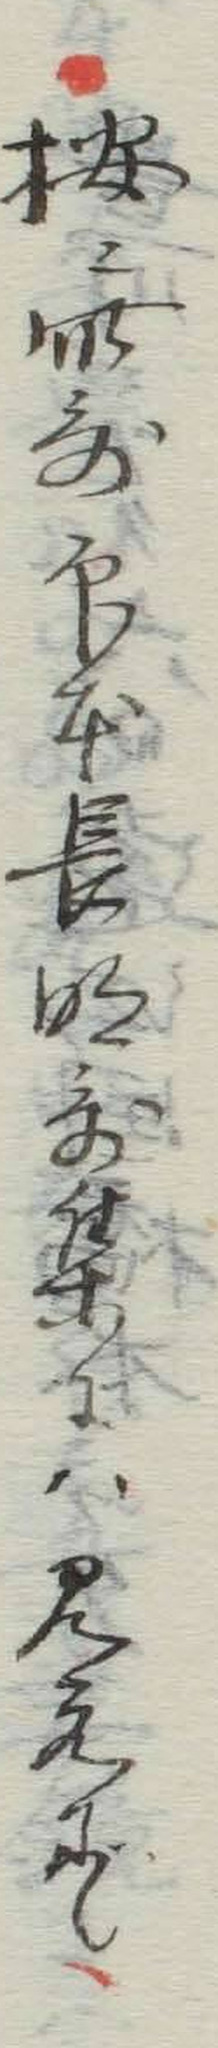●按ニ此歌印本長明歌集には見えず、
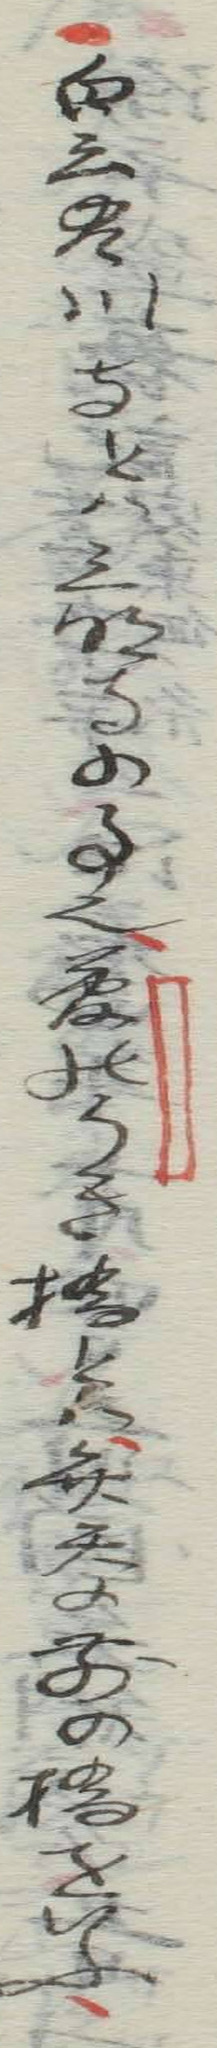●白云豊川寺とは三明寺の事也、夢のうき橋とは、弁天の前の端をいふ、
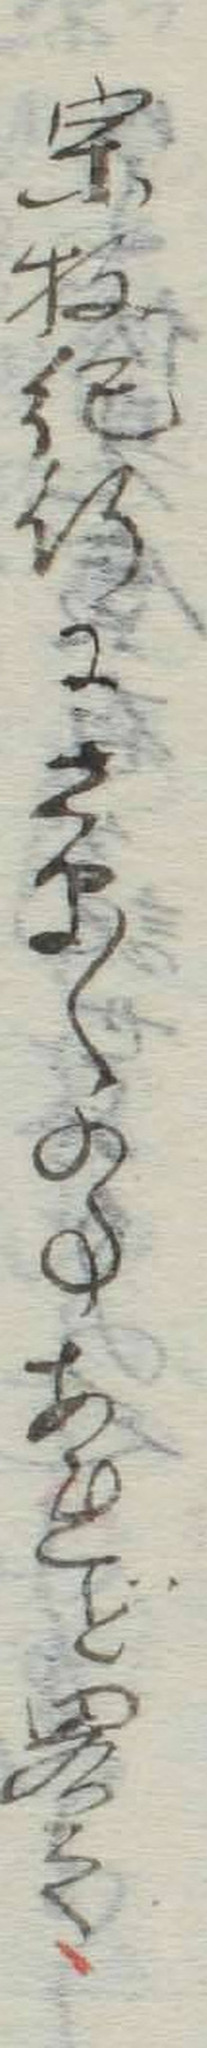宗牧紀行にさま〳〵の事あれど略之、
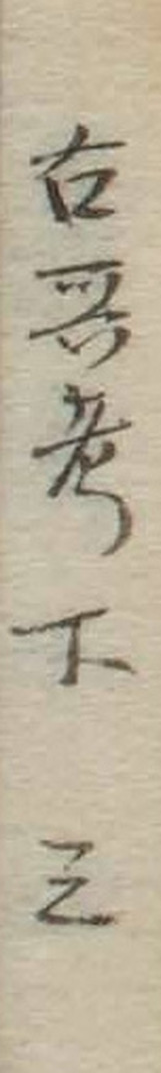古歌考下三
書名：三河国古跡考
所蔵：国文学研究資料館
